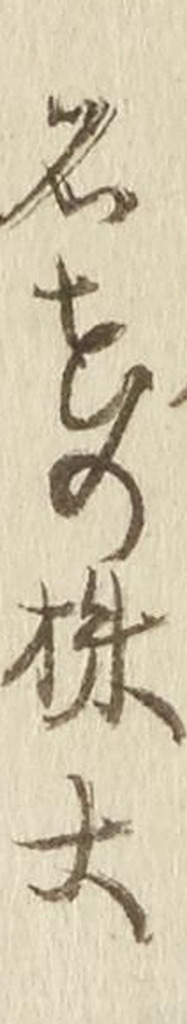名花の株大
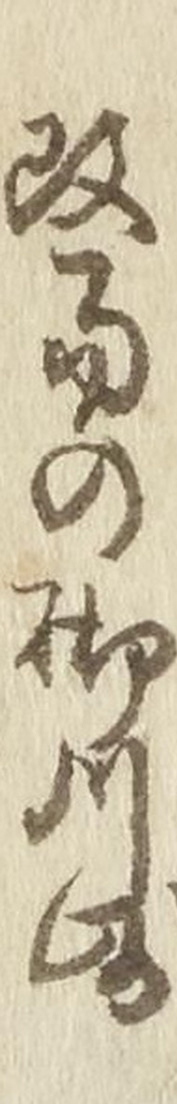改易の砌川崎
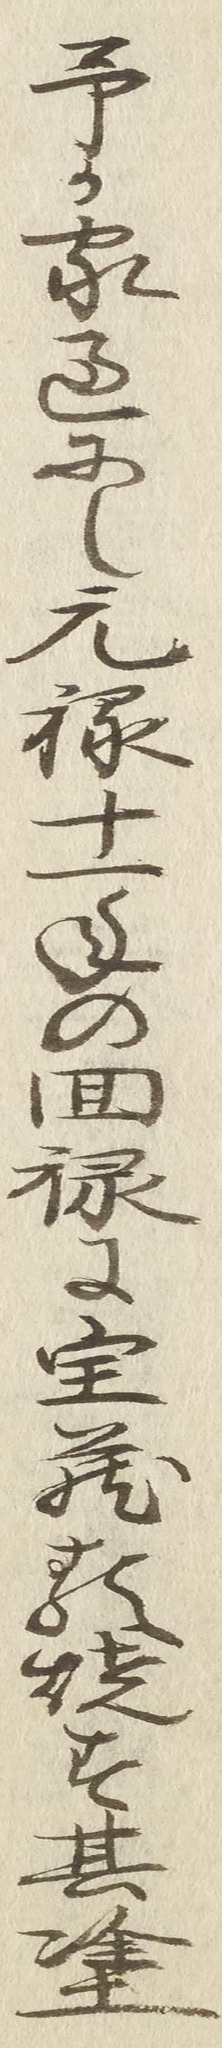予か家過にし元禄十一年の回禄に宝蔵類焼す其塗
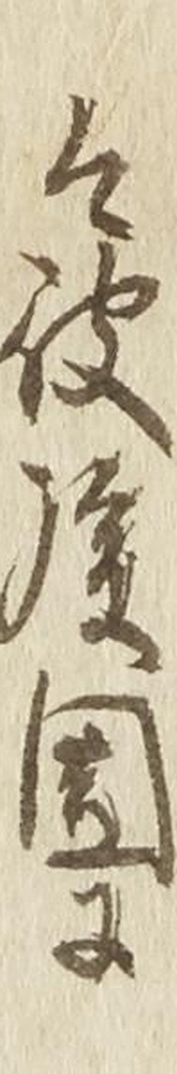今彼後園に
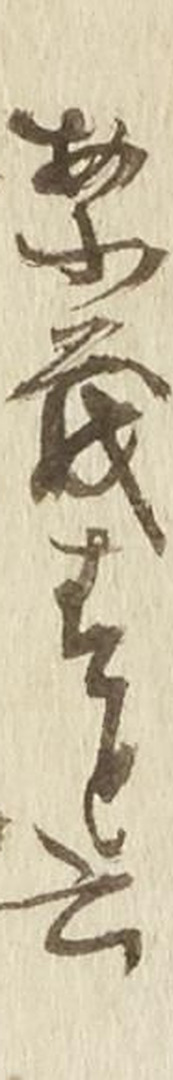繁茂すと云
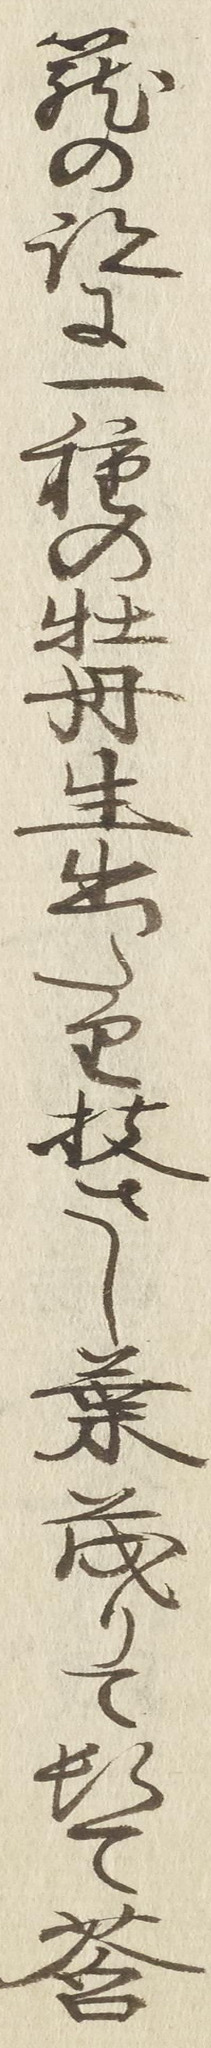籠の跡に一種の牡丹生出たり枝さし葉茂りて斯て莟
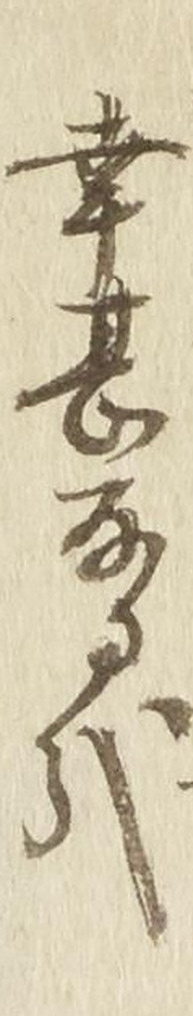幸甚なる哉
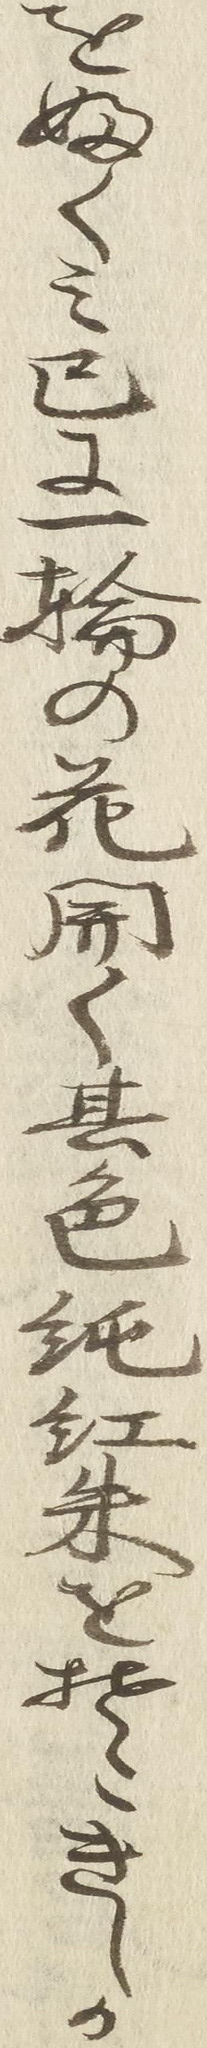をふくみ已に一輪の花開く其色純紅朱をそゝきしか
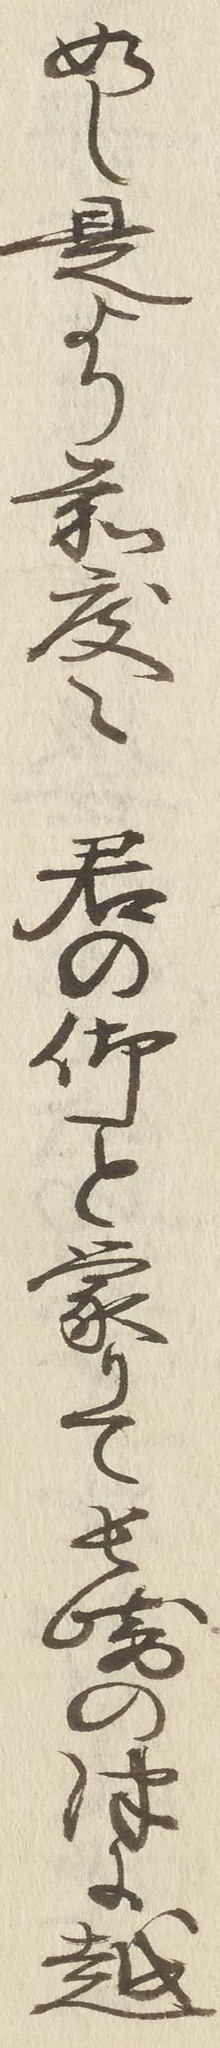如し是より前度々君の仰を蒙りて長崎の津に越
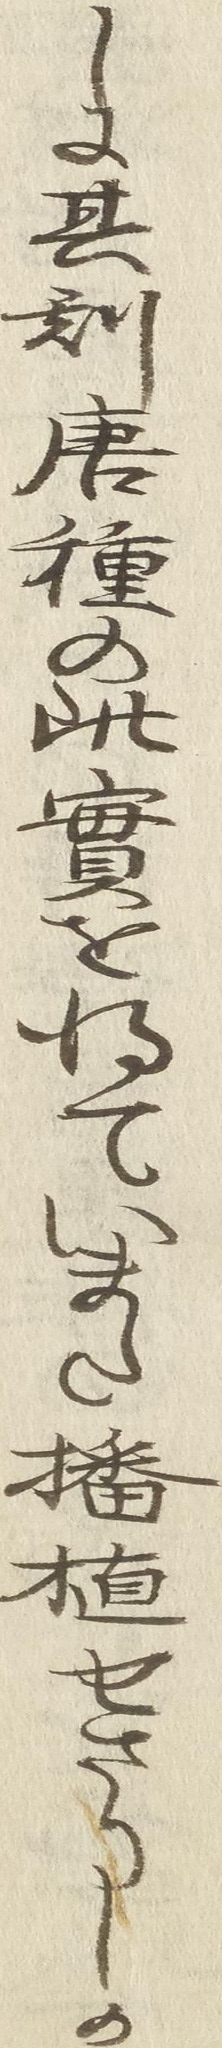しに其刻唐種の此実を得ていまた播種せさりしか
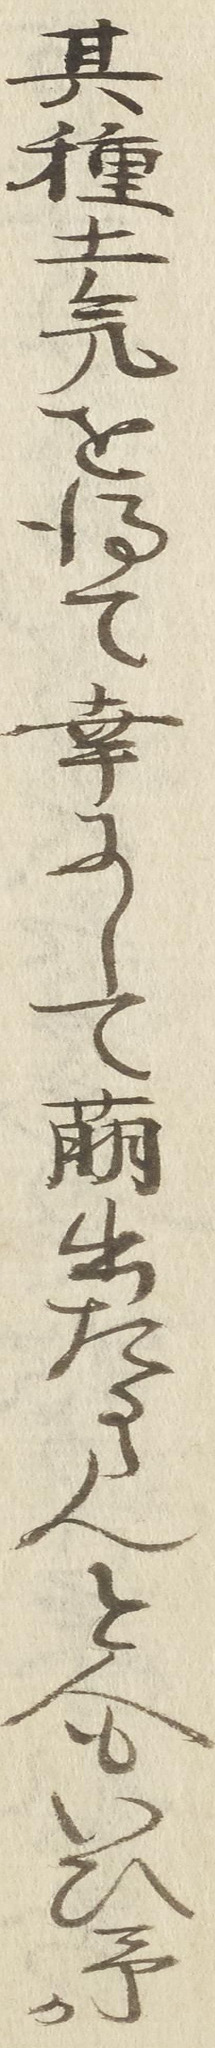其種土気を得て幸にして萌出たらんと人もいひ予か
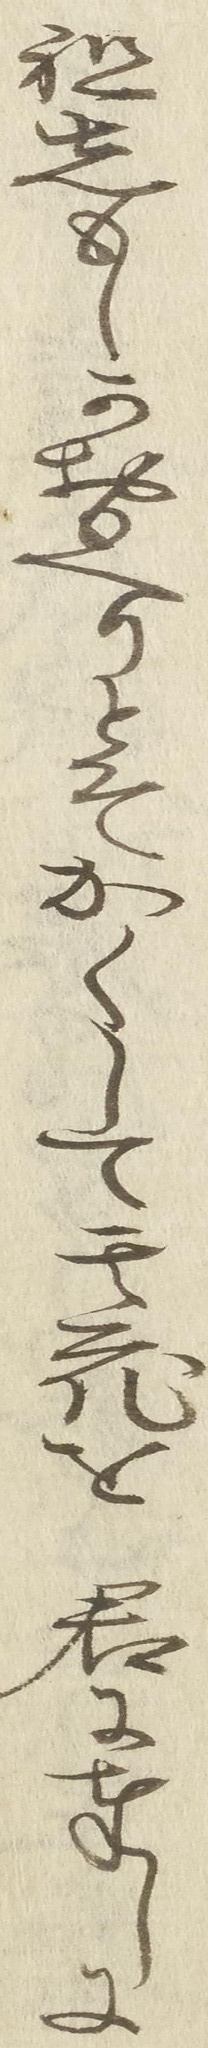祖先もしかおるへりとそかくして其花を君に奉しに
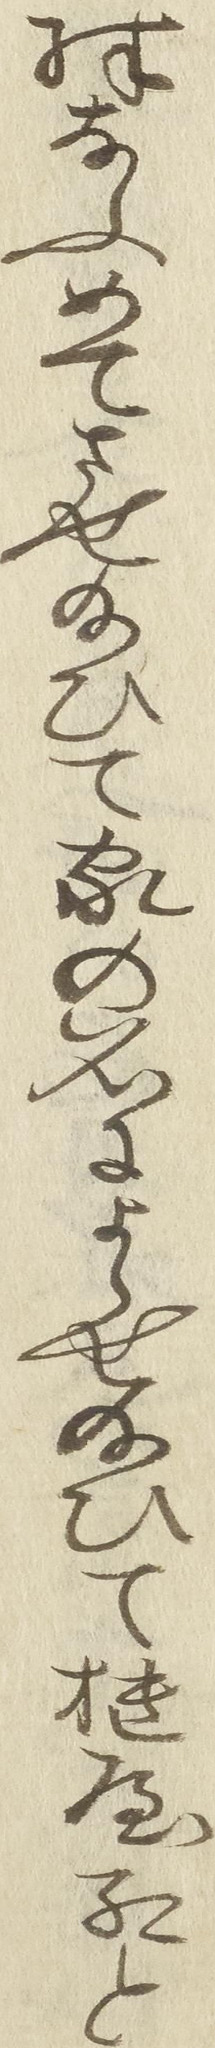殊なふめてさせ為ひて家の名によらせ為ひて櫃屋紅と

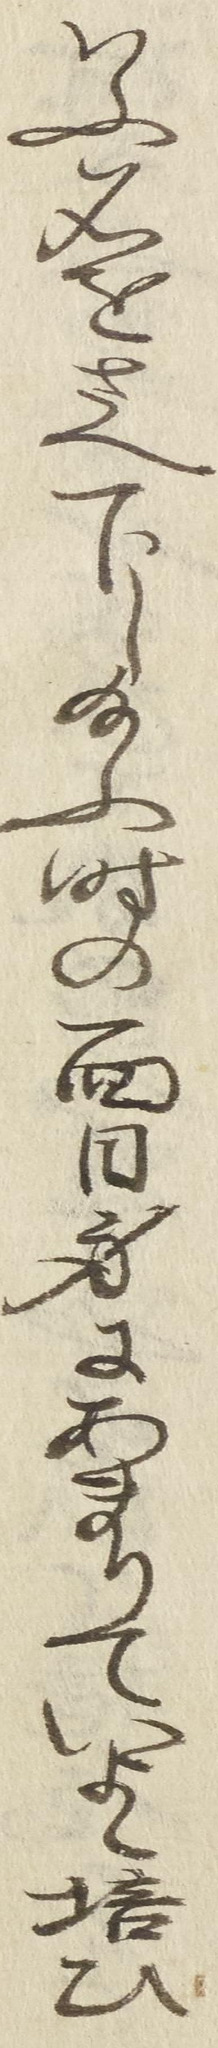いふ名をさへ下し為ふ時の面目身にあまりていよ〳〵培ひ
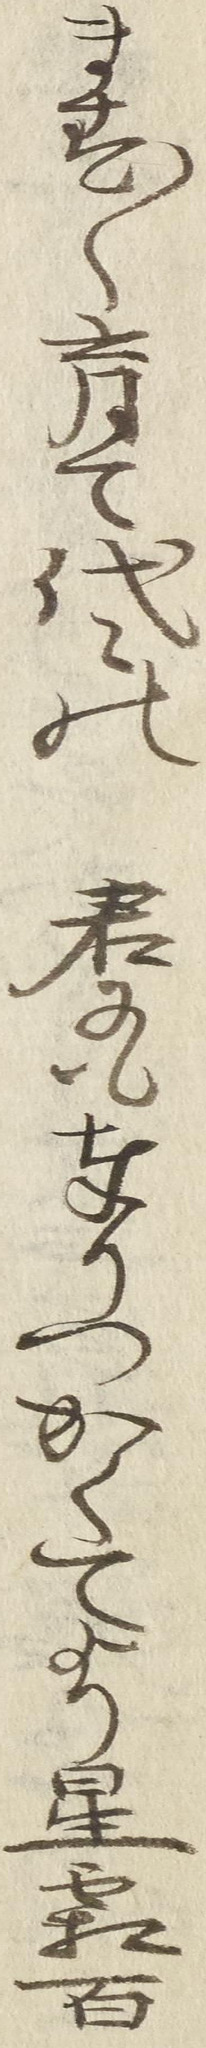ます〳〵育て代々の君にも奉りつかくてより星霜百
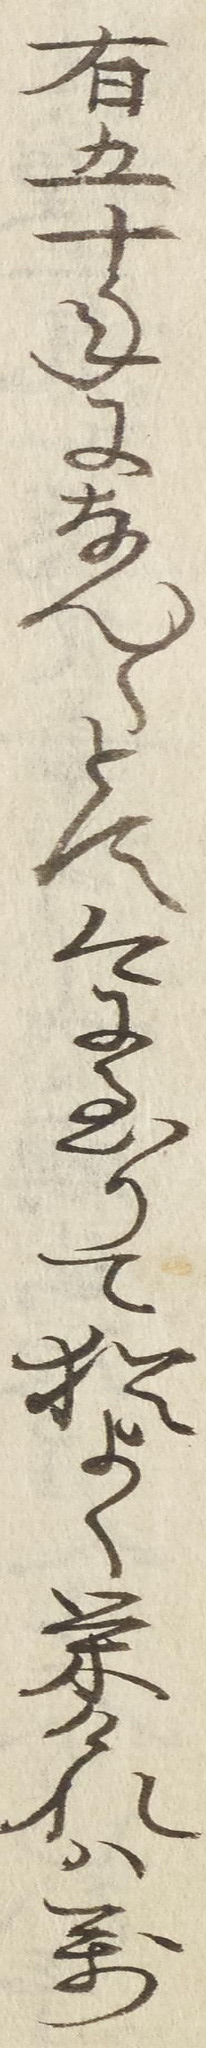有五十年になん〳〵とす今に至りて猶よく栄けれは萬邦
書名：地震記　上
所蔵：東京大学地震研究所図書室 Earthquake Research Institute Library, The University of Tokyo, JAPAN
